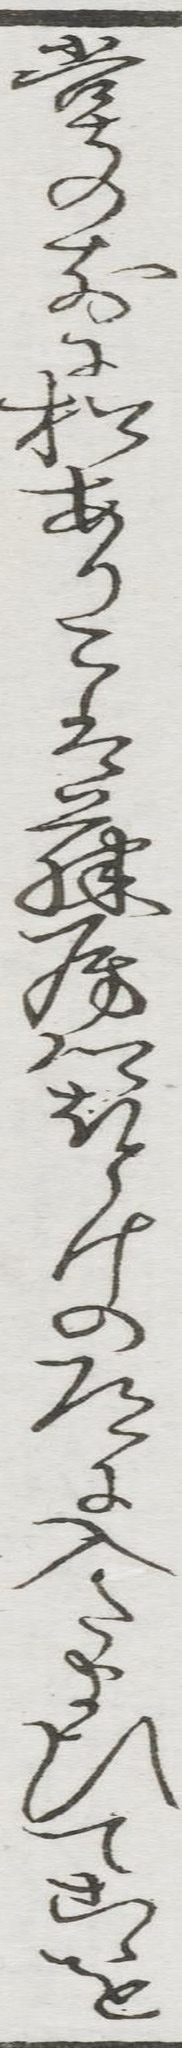堂の前に松ありこは藤房卿ほとけの道に入たまひてこゝを
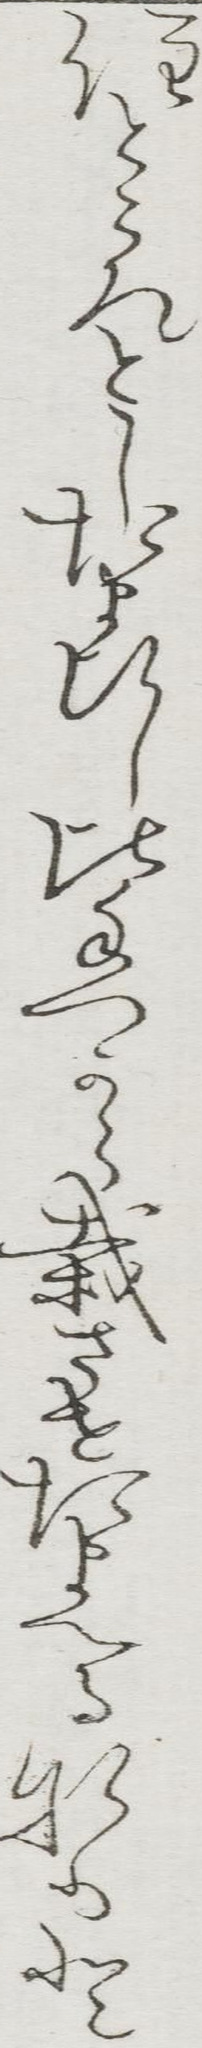住ところとしたまひし頃手つから栽させたまへるなりと
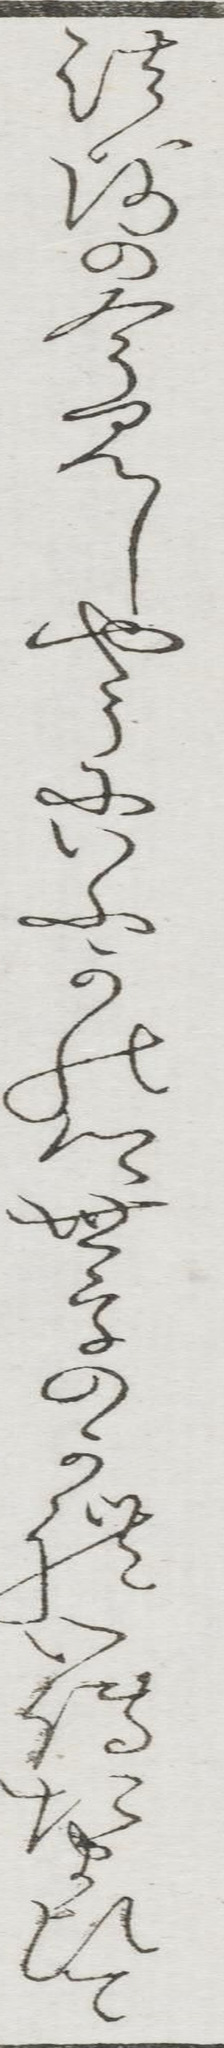法師の今見しやうにいふかの卿世をのかれいてたまひて
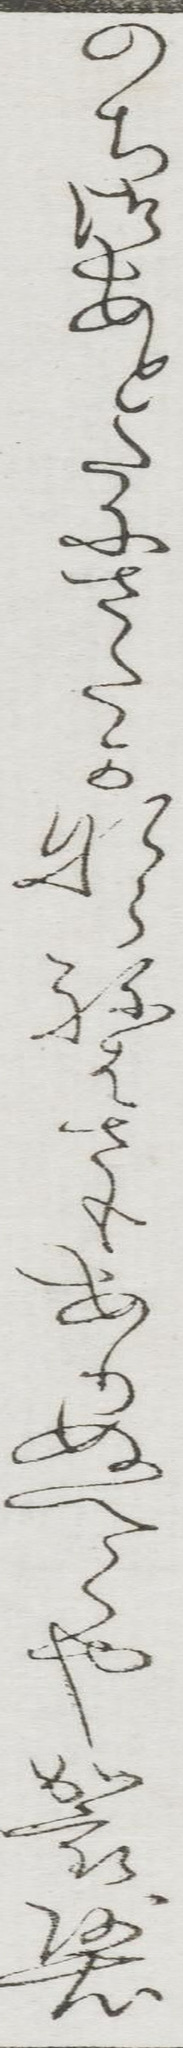のち御あとたにさたかならねはさもありぬへくや袈裟
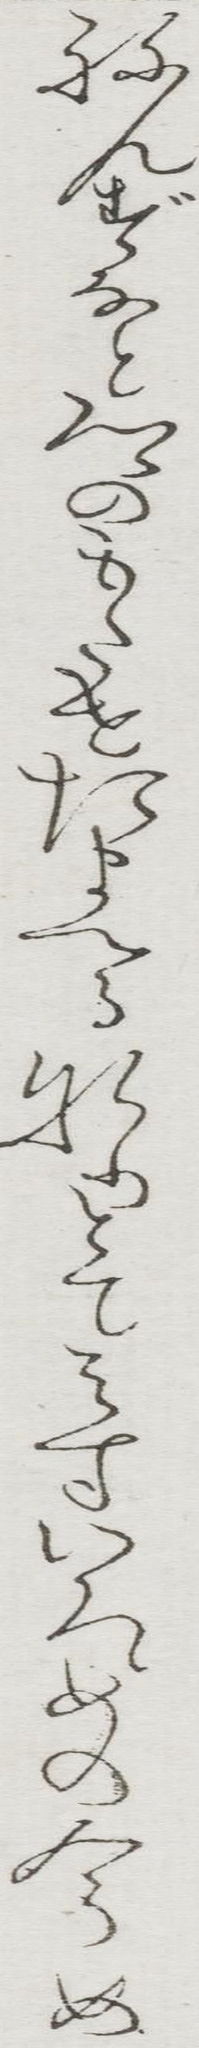ねんずなと卿のもたせたまへるなりとてみすいろめの今め
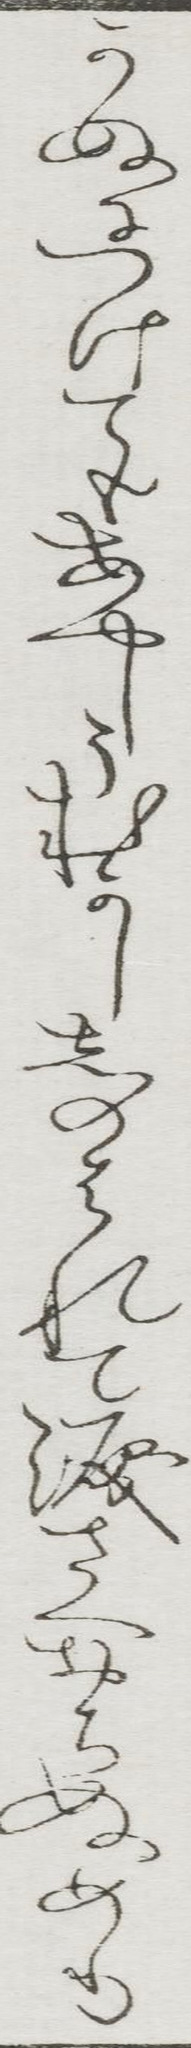かぬにつけてもあやしうむかししのはれて涙さへおちぬめり
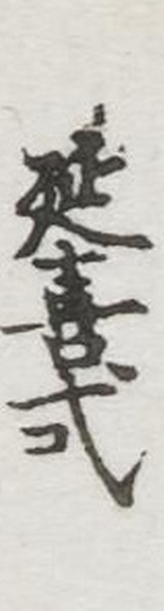延喜式
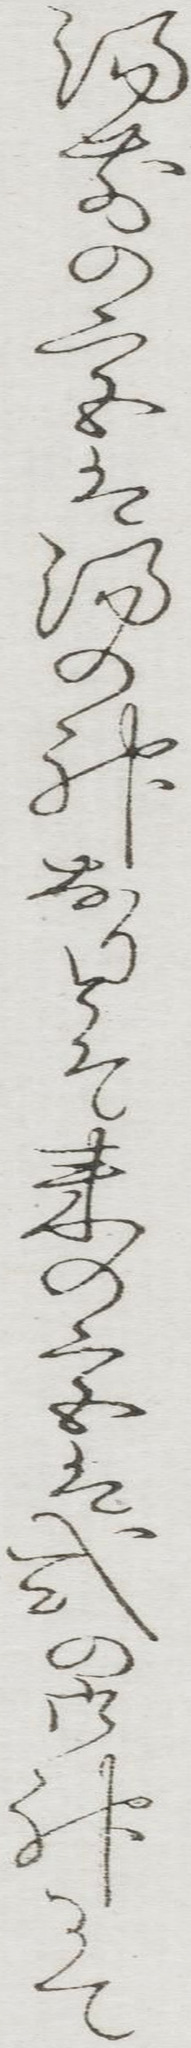湯前の宮は湯の神なりとそ来の宮は式の御神にて
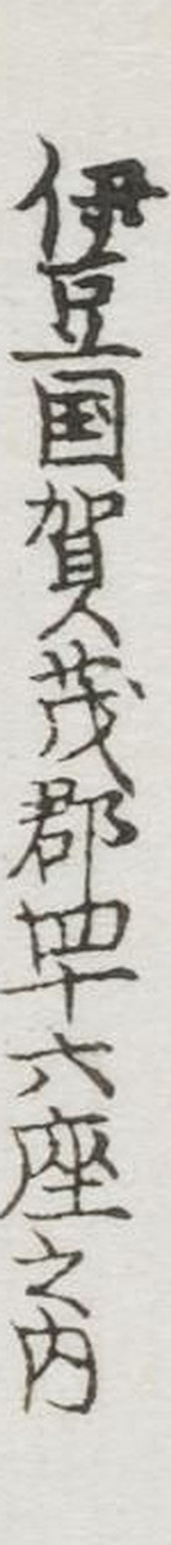伊豆国賀茂郡四十六座之内
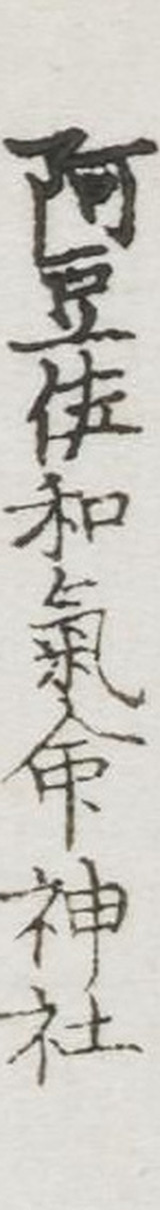阿豆佐和氣命神社
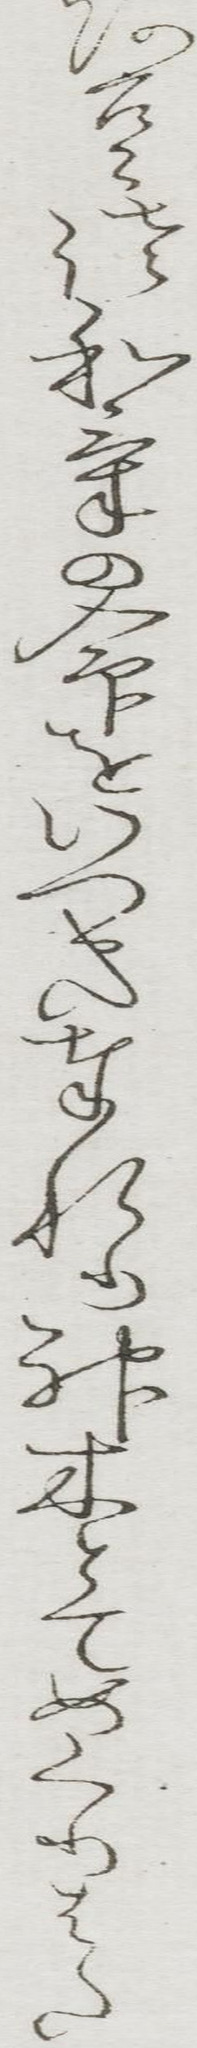阿豆佐和気の命をいつき奉れり神木とてめくりはた
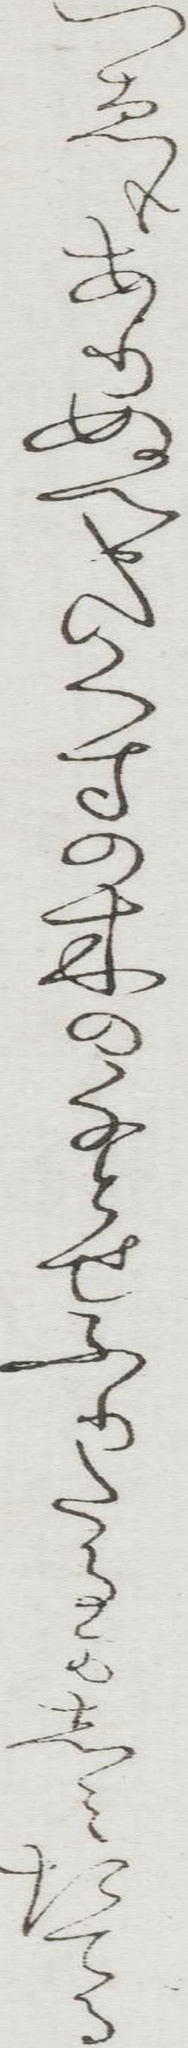つゑもありぬへきくすの木の千とせふりたるかしみたてる
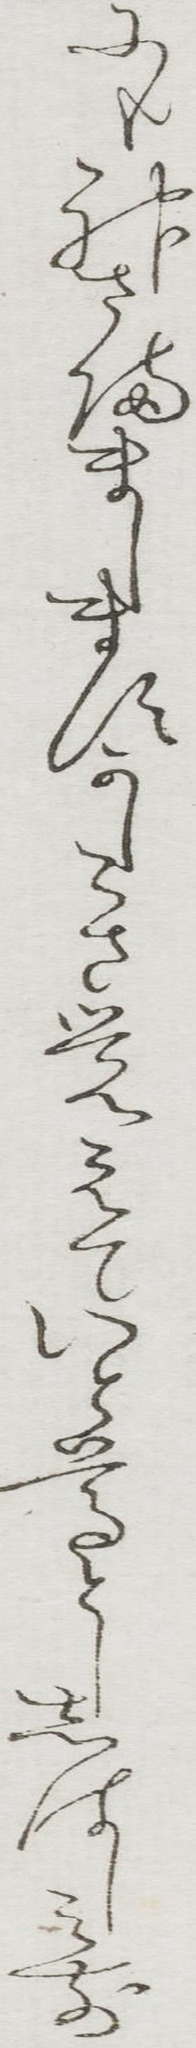にも神さまましますかしこさ覚えていと尊とししはしみ前
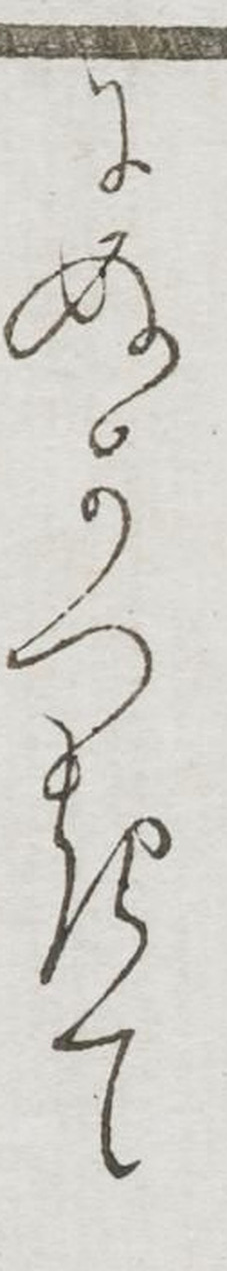にぬかつきて
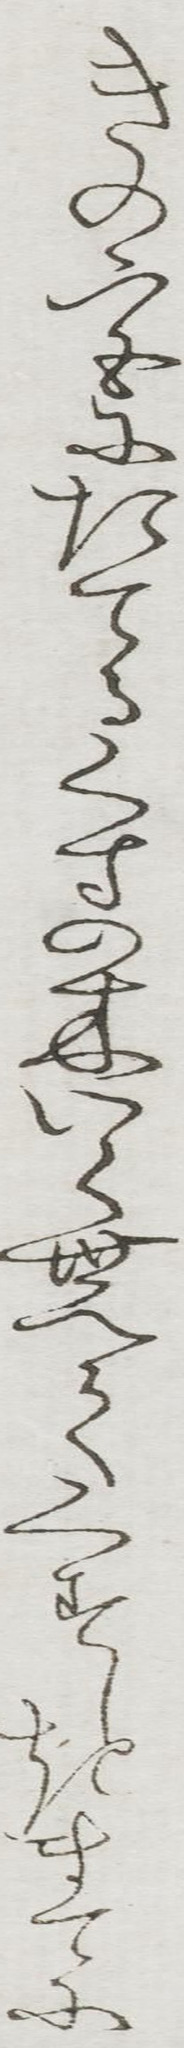きの宮にたてるくすの木いく世へてくすしきまてに

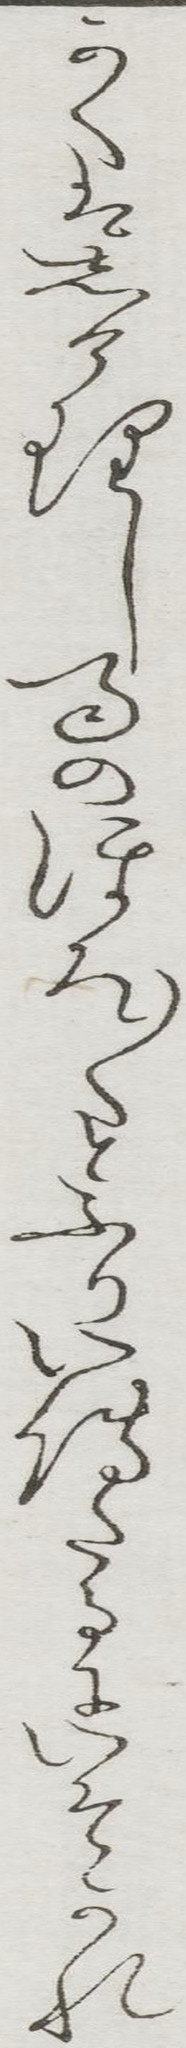かくはしけりし雨のほそ〳〵とふりいてたるにいそかれ
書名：挿画熱海日記　全
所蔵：東京大学地震研究所図書室 Earthquake Research Institute Library, The University of Tokyo, JAPAN
